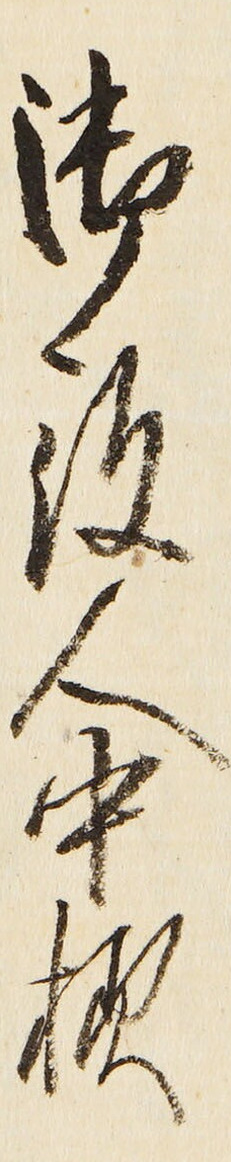御役人中様
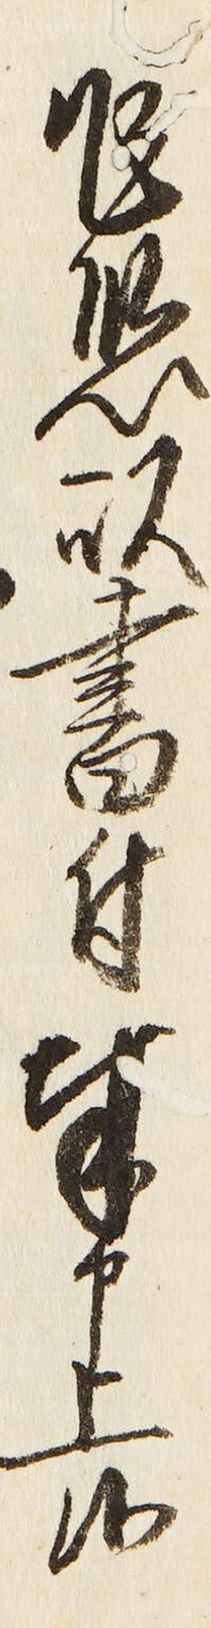乍恐以書付奉申上候
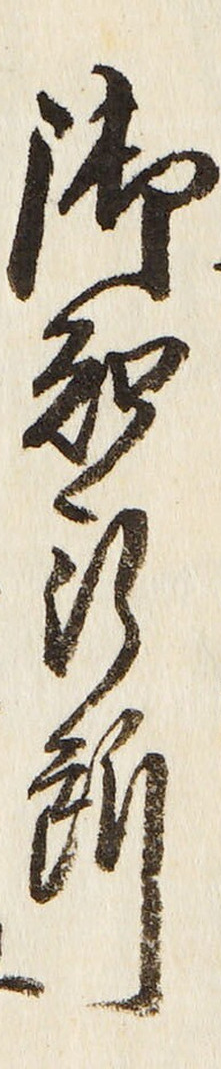御知行所
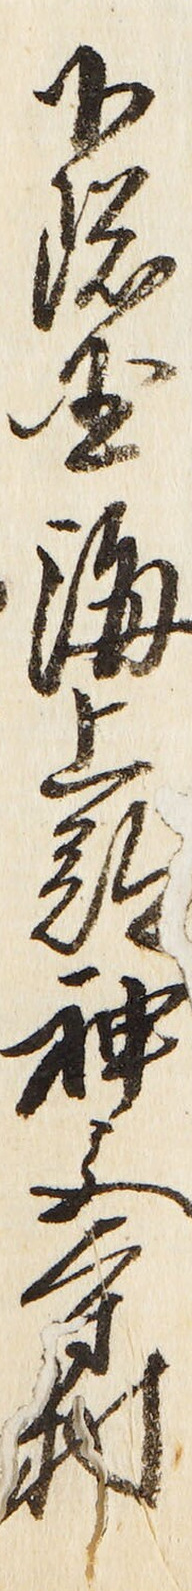下総国海上郡神宮寺村
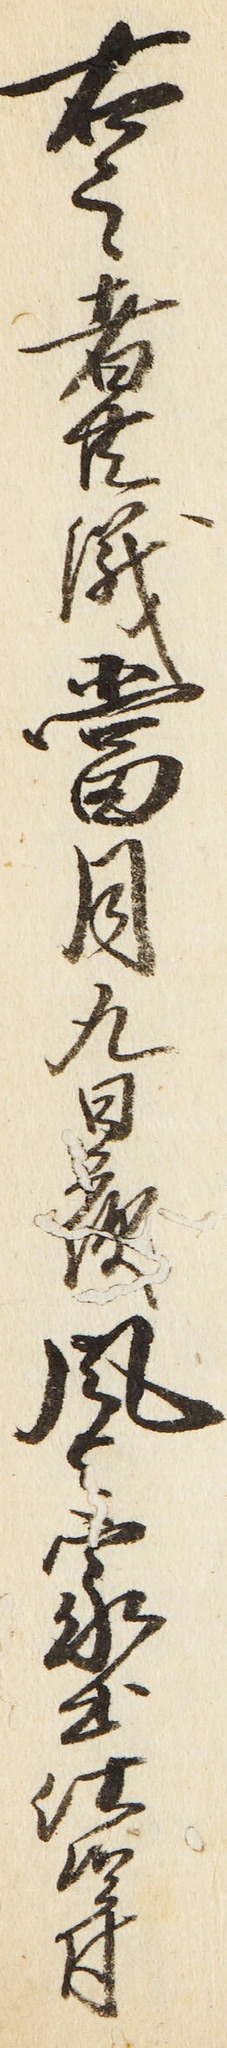右之者共儀当月九日夜風与家出仕候ニ付

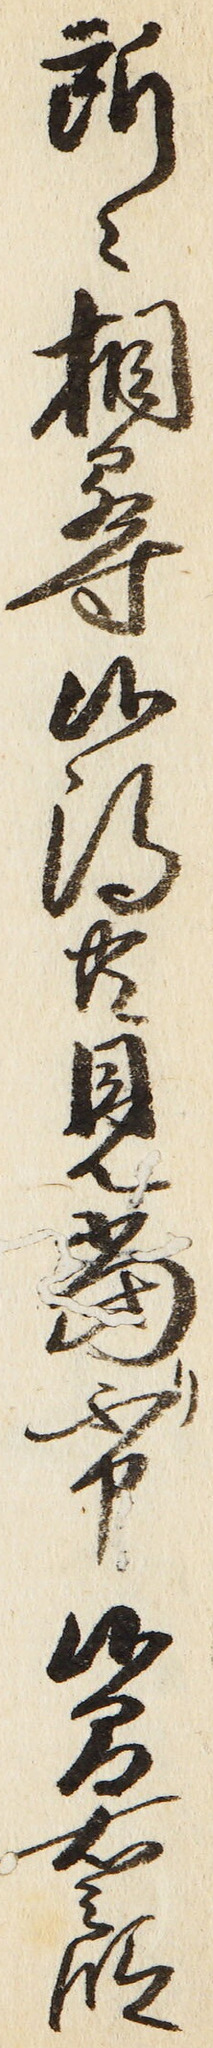所々相尋候得共見当り不申候間右之段
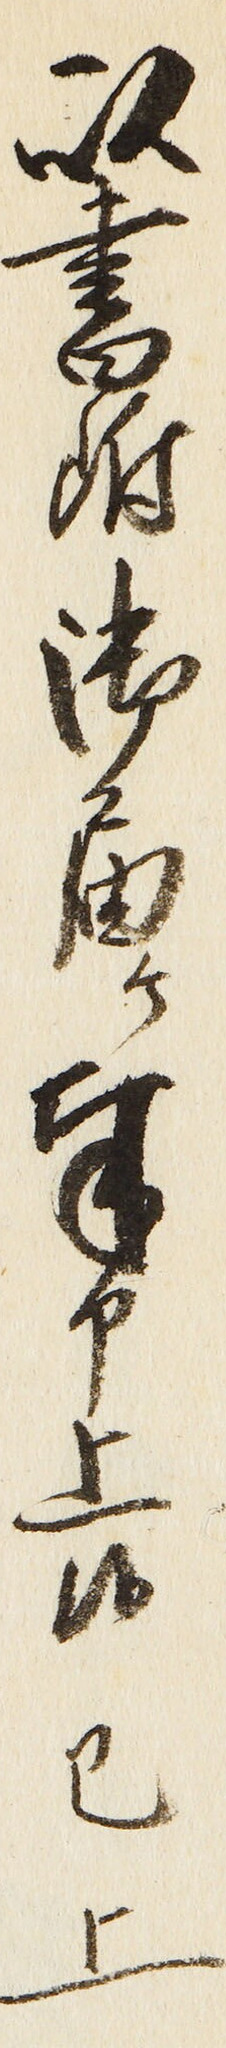以書付御届ケ奉申上候已上
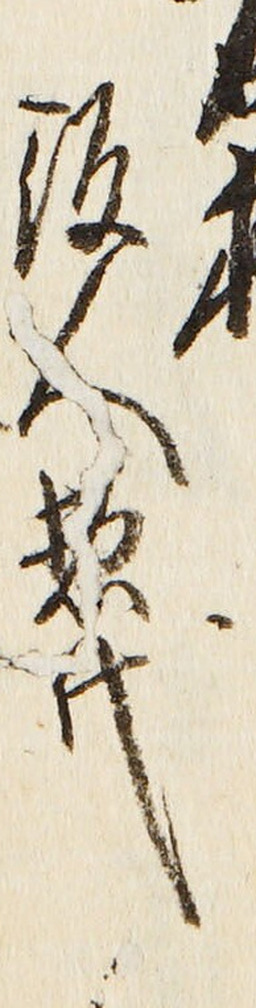役人惣代
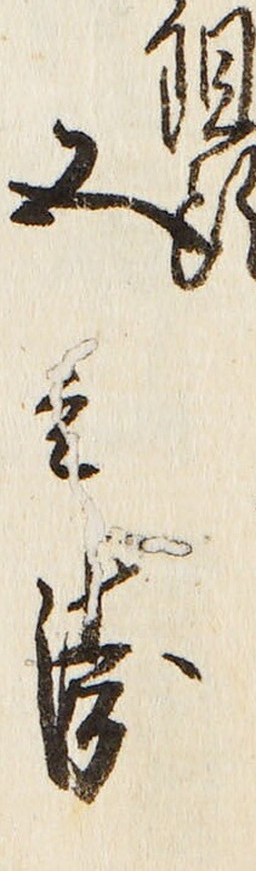五兵衛
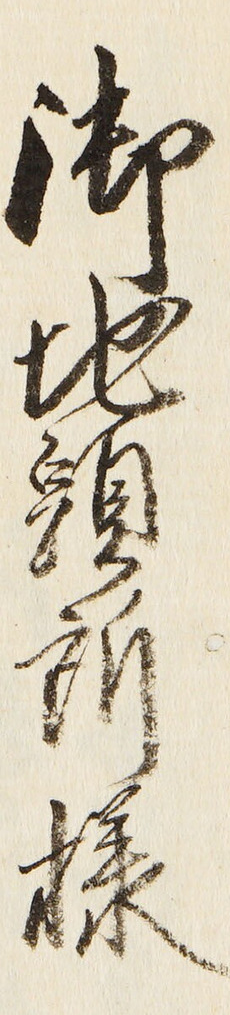御地頭所様
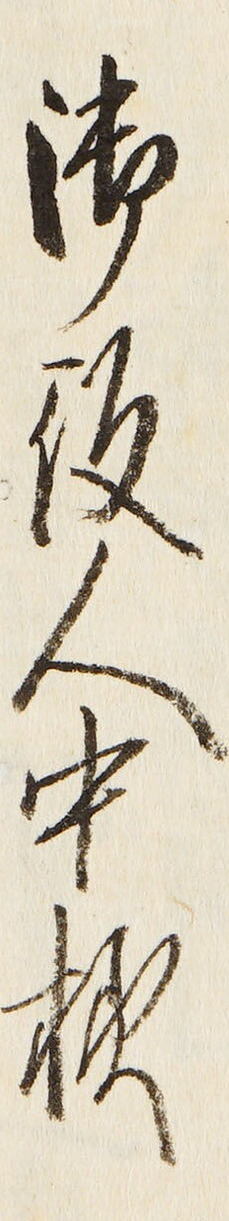御役人中様
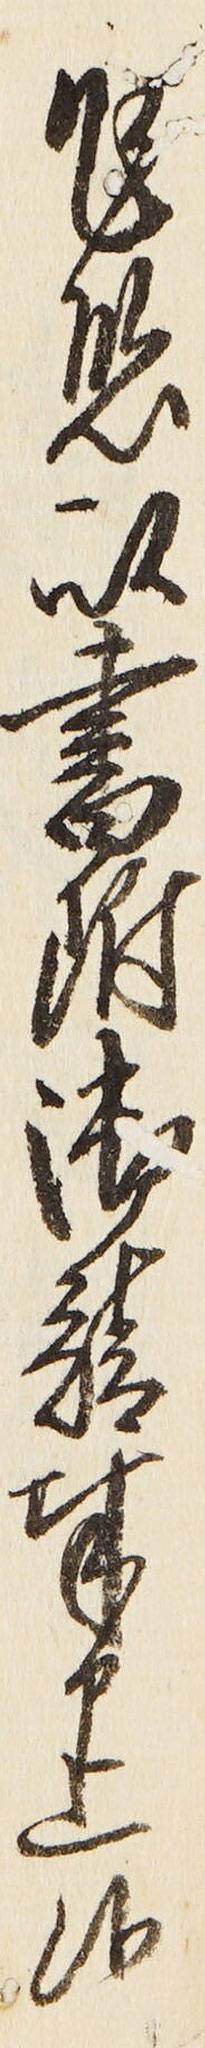乍恐以書付御請奉申上候
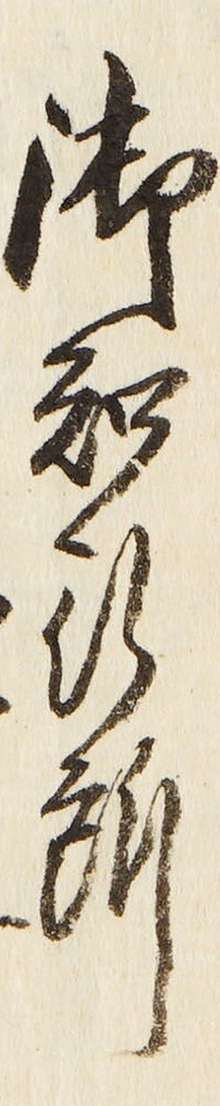御知行所
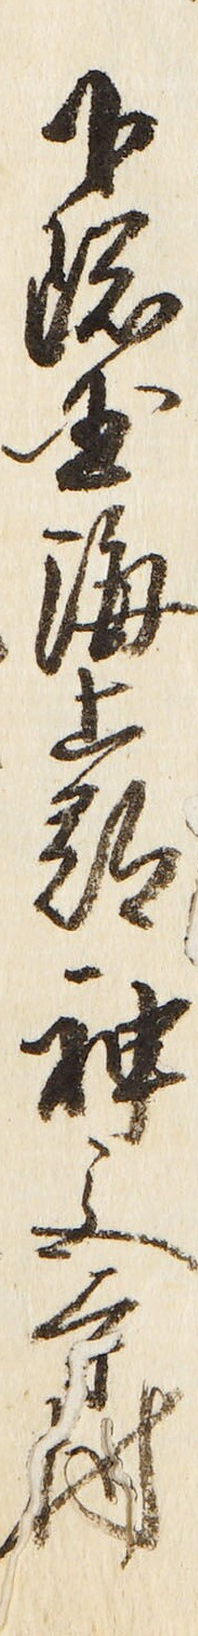下総国海上郡神宮寺村
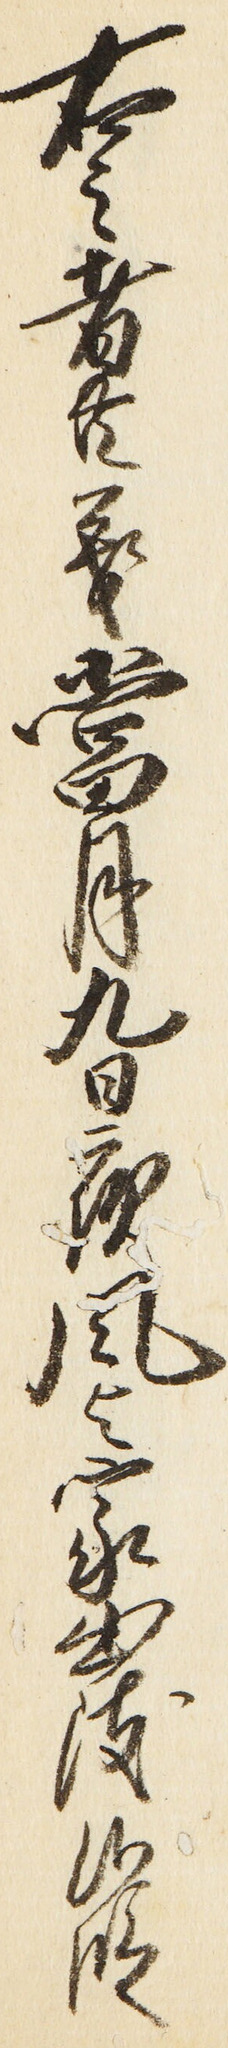右之者共義当月九日夜風与家出致候段

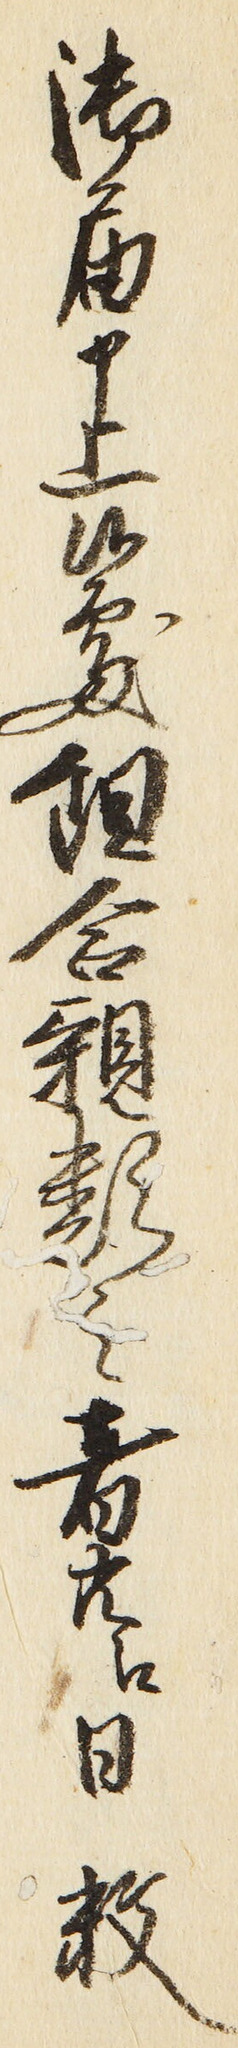御届申上候処組合親類之者共江日数
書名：難船一件記録
